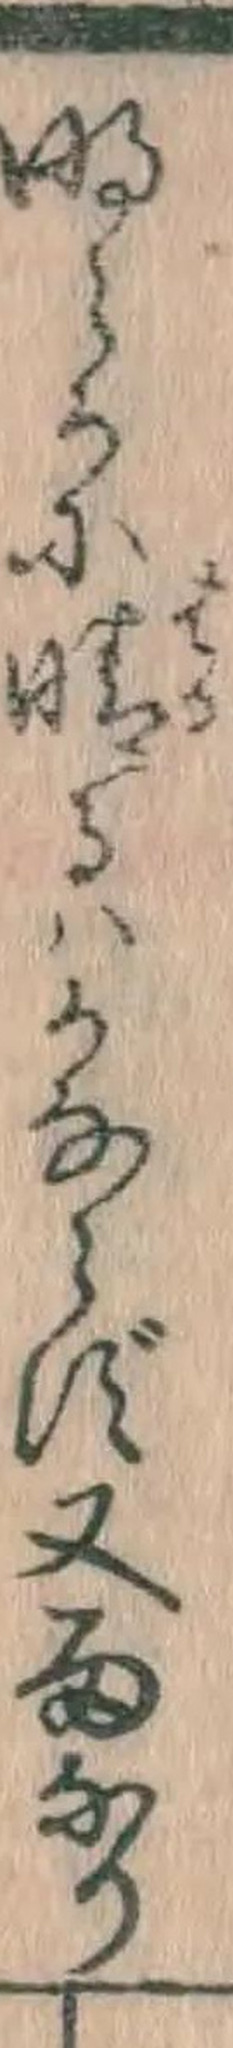明らかに晴るはかならず又雨なり
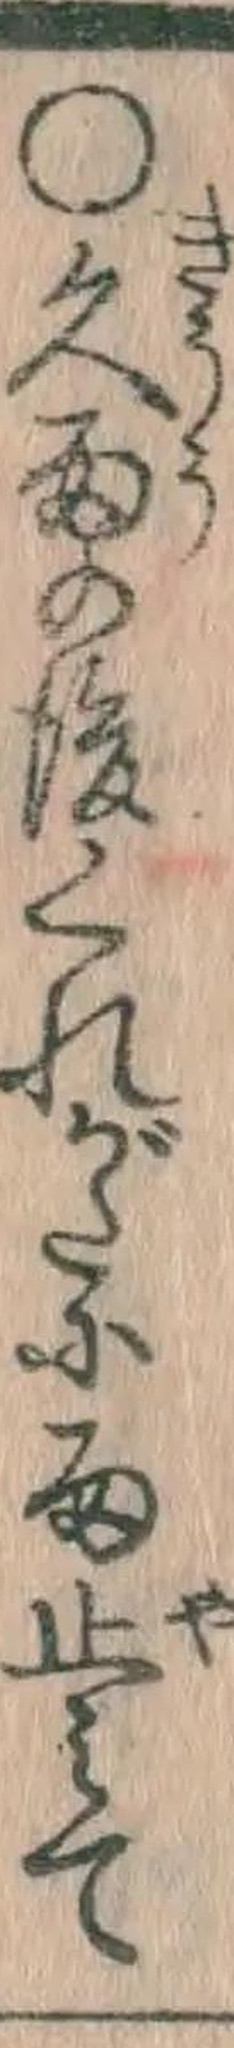○久雨の後くれがたに雨止みて
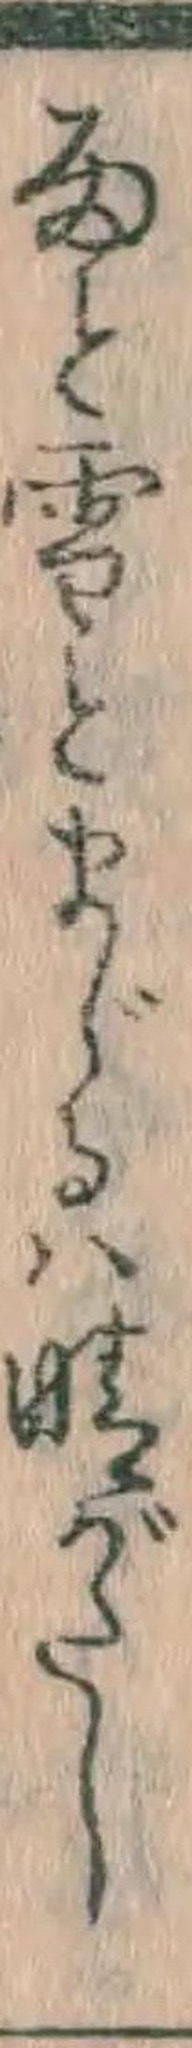雨と雪とまじるは晴がたし
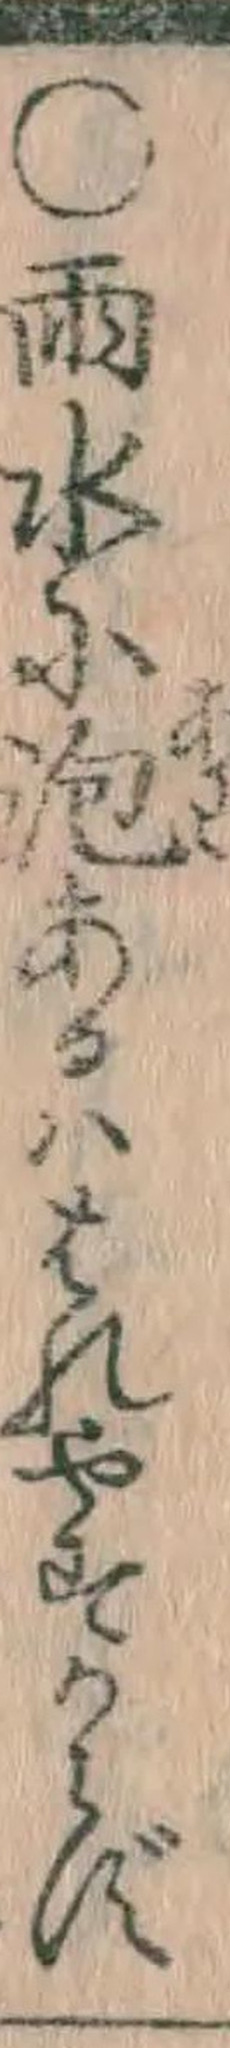○雨水に泡あるははれやすからず
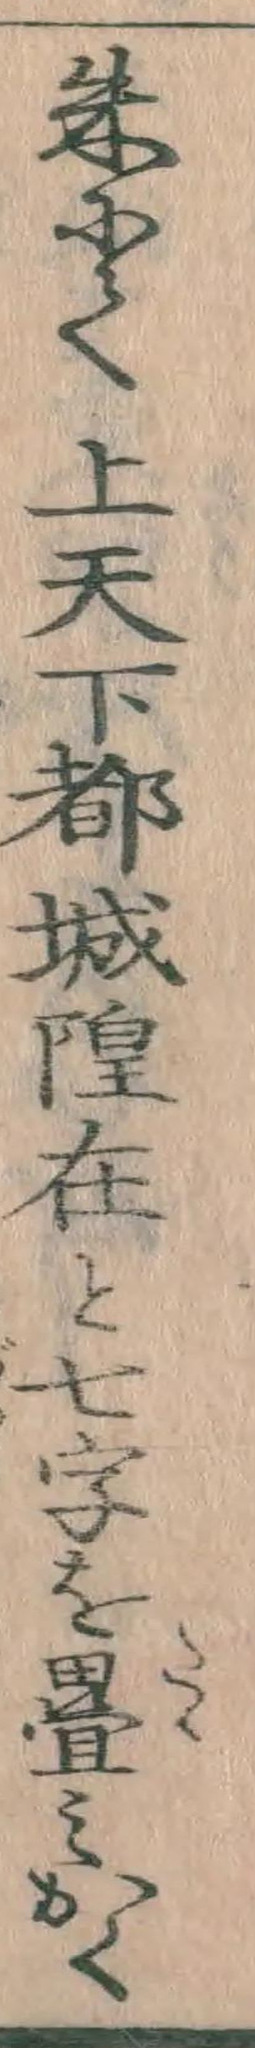朱にて上天下都城隍在と七字を畳みかく
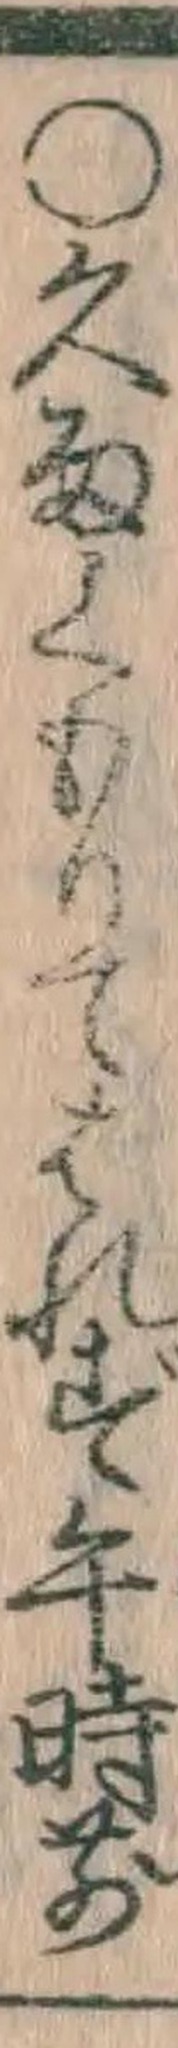○久雨くもりてはれず午時前
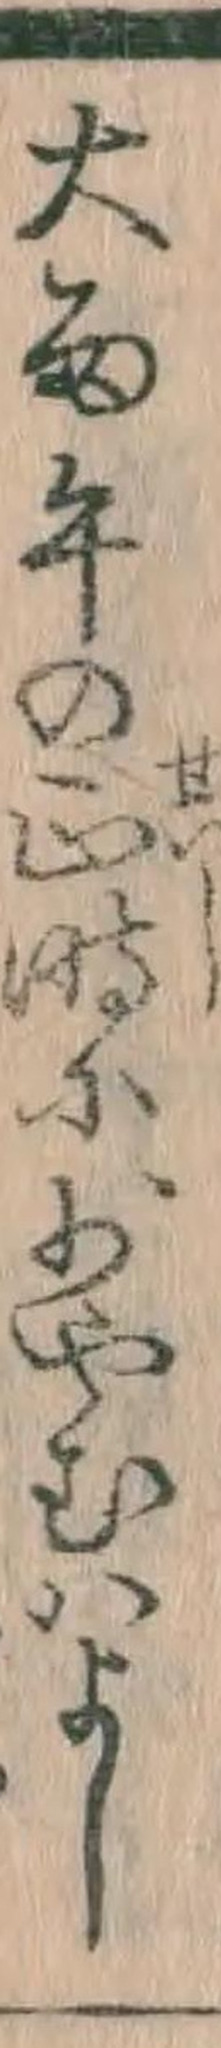大雨午の正時に少やむはよし
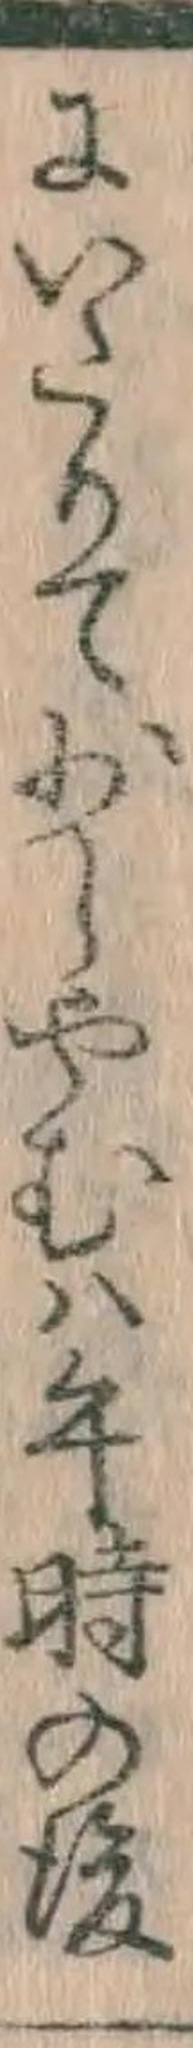にいたりて少しやむは午時の後
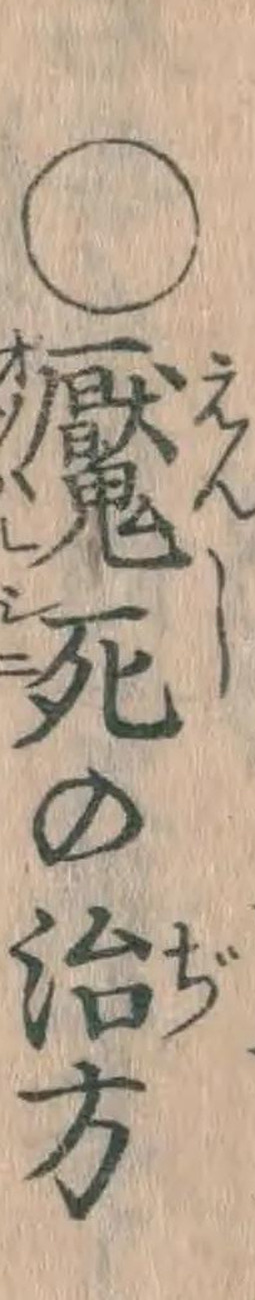○魘死の治方
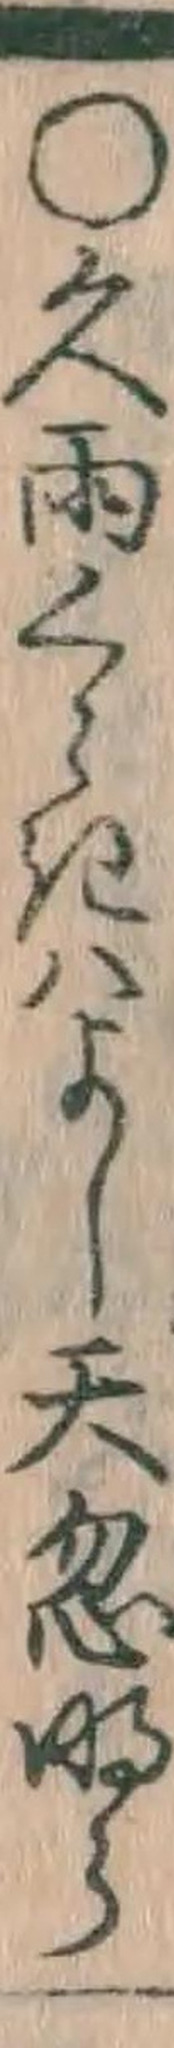○久雨くらきはよし天忽明ら
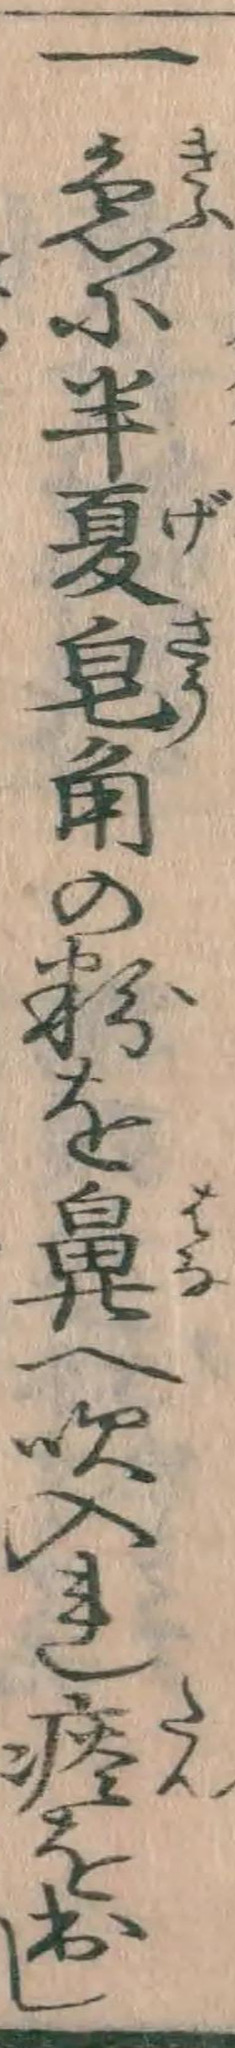一急に半夏皂角の粉を鼻へ吹入れ痰を出し
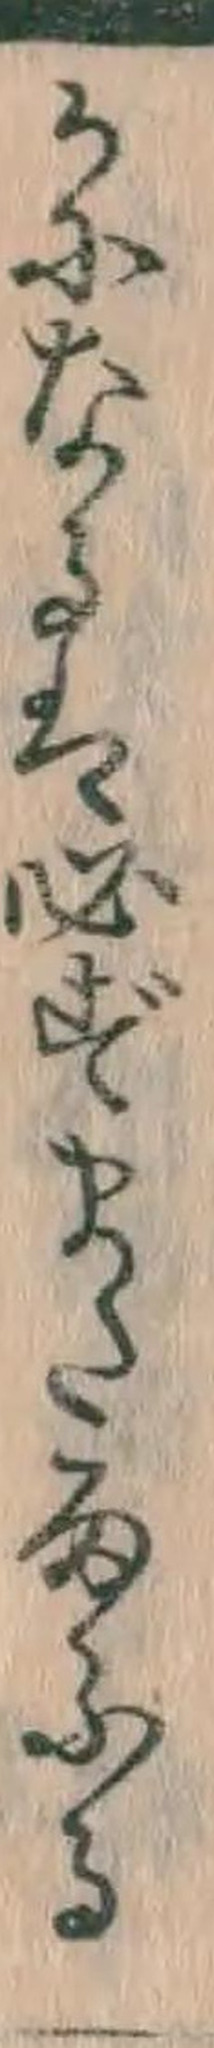かになるは必ずまた雨ふる
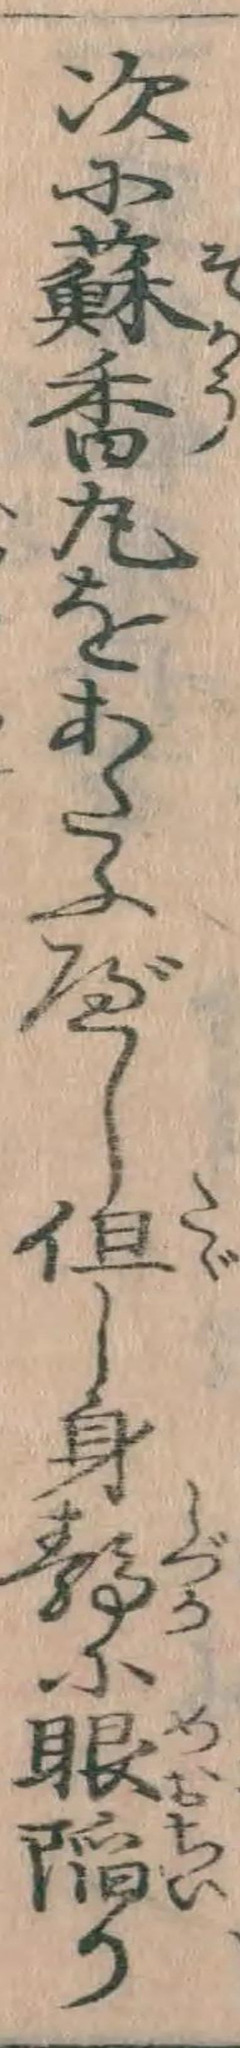次に蘇香丸をあたふべし但し身静に眼陥り
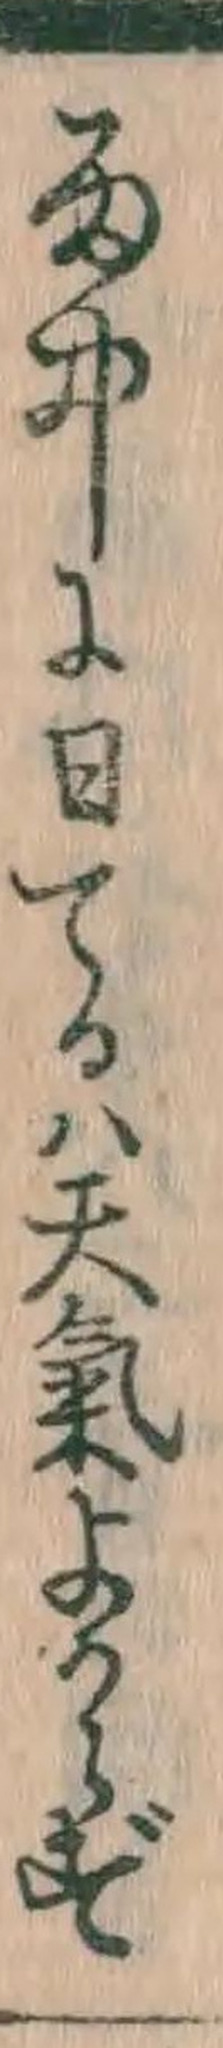雨中に日てるは天気よからず
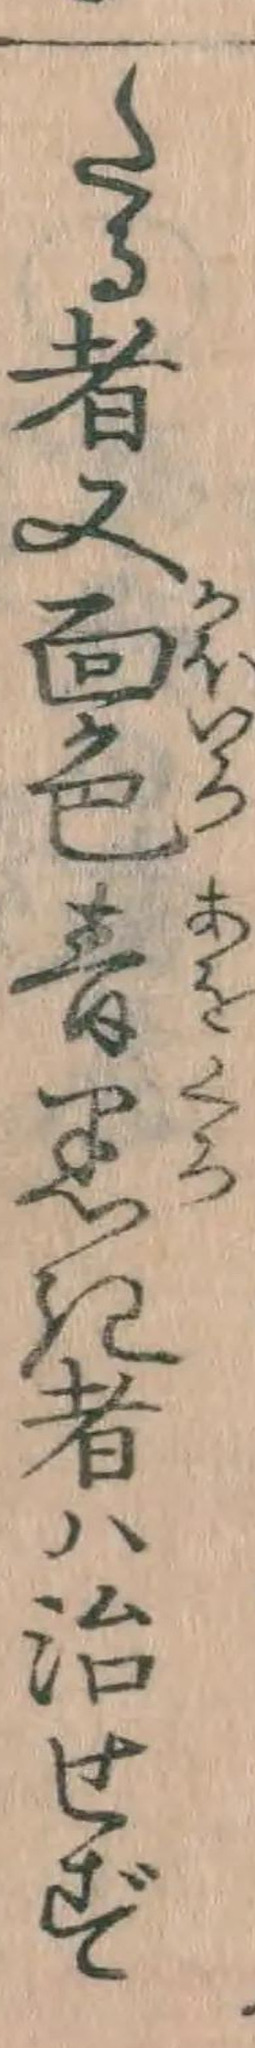たる者又面色青黒き者は治せず
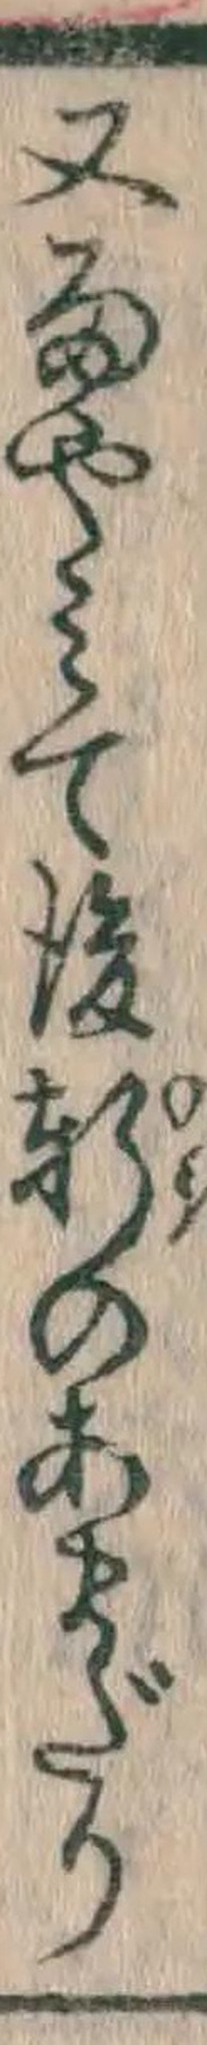又雨やみて後軒のあまだり
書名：広益秘事大全 3巻. [4]
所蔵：国立国会図書館 National Diet Library, JAPAN
